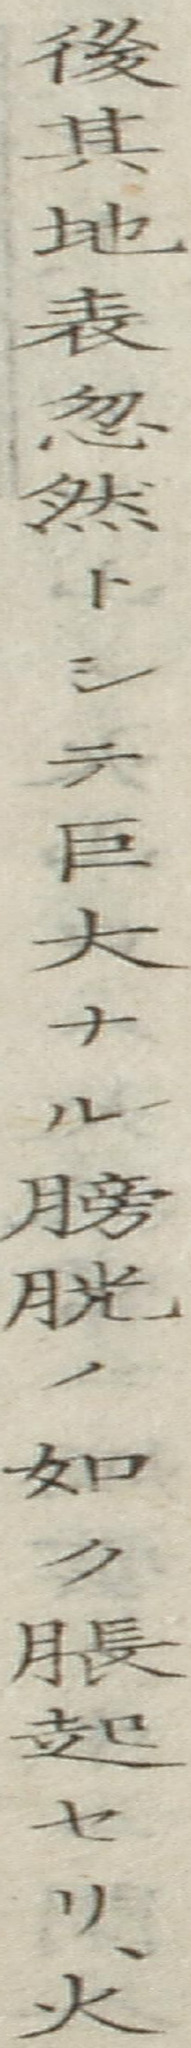後其地表忽然トシテ巨大ナル膀胱ノ如ク張起セリ、火
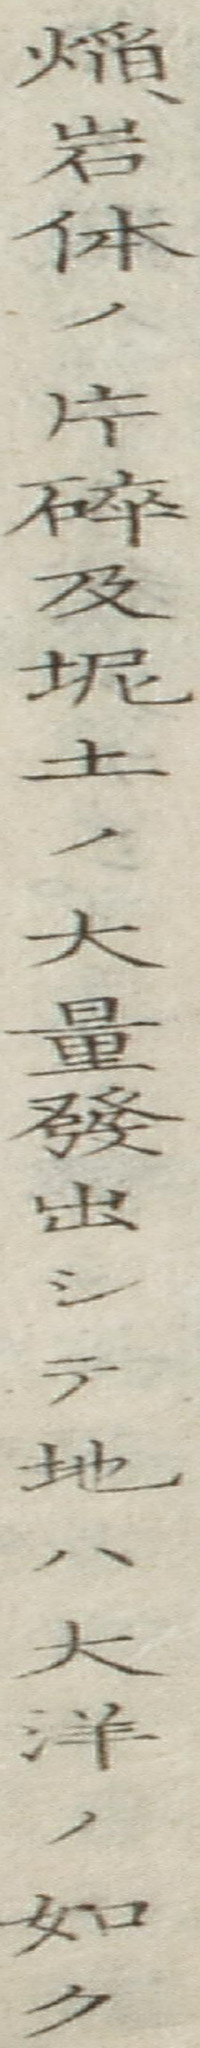焔、岩体ノ片砕及泥土ノ大量発出シテ地ハ大洋ノ如ク
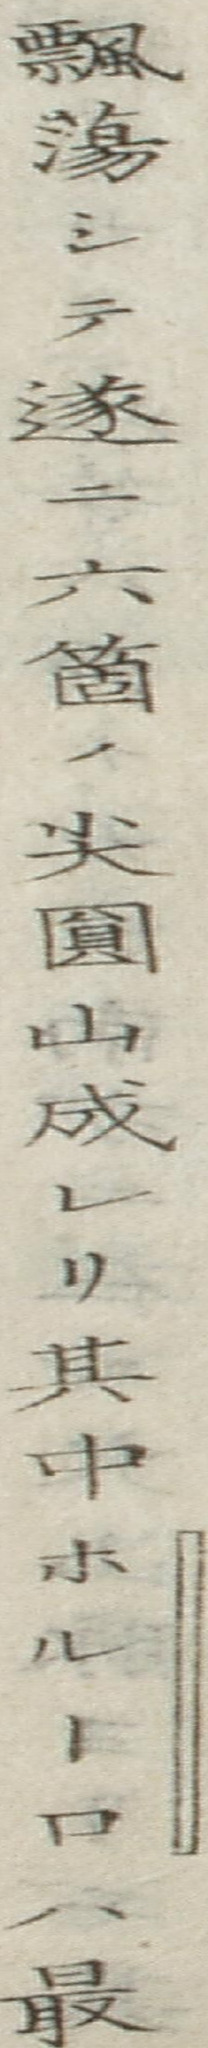飄蕩シテ遂ニ六箇ノ尖円山成レリ其中ホルーロハ最
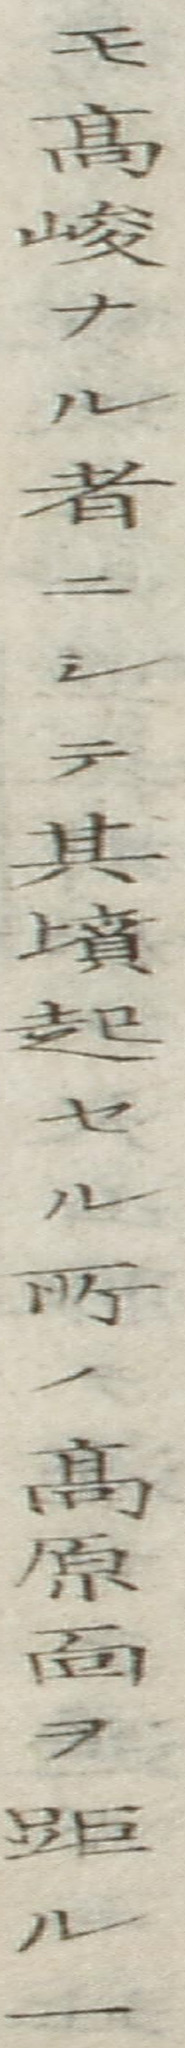モ高峻ナル者ニシテ其墳起セル所ノ高原面ヲ距ル一
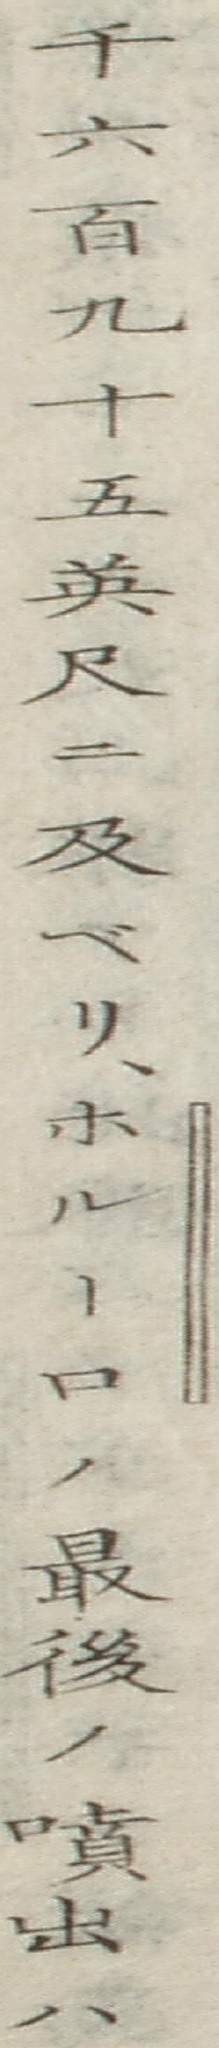千六百九十五英尺ニ及ベリ、ホルーロノ最後ノ噴出ハ
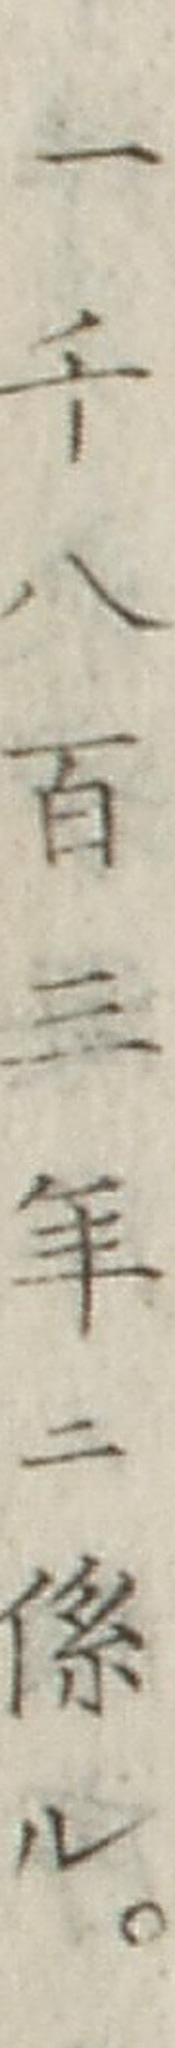一千八百三年ニ係ル。

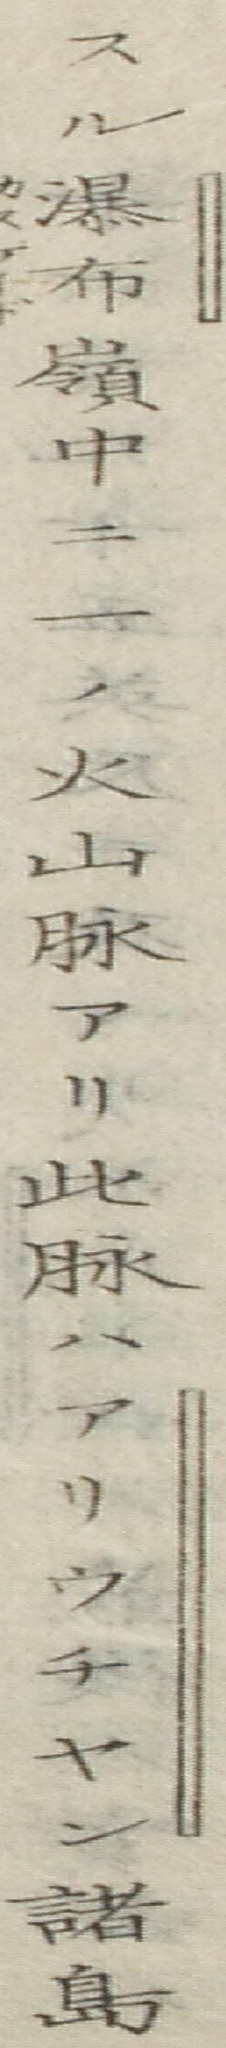スル瀑布嶺中ニ一ノ火山脈アリ此脈ハアリウチヤン諸島
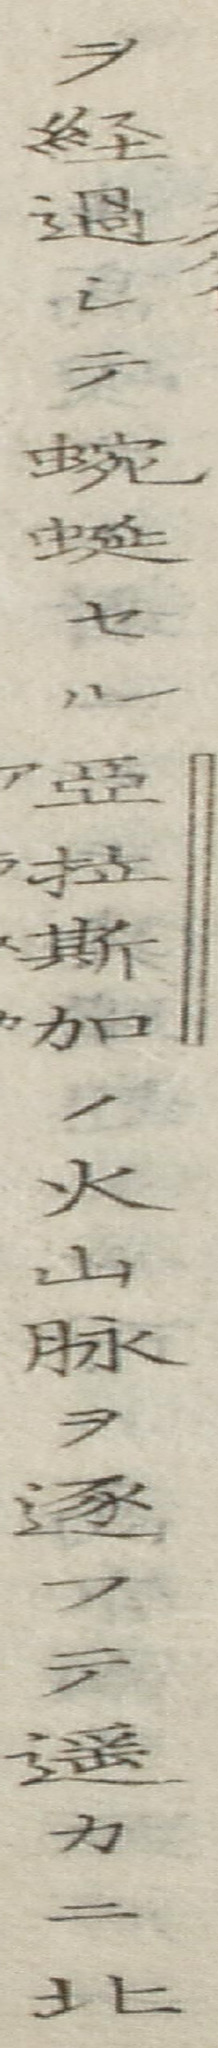ヲ経過シテ蜿蜒セル亜拉斯加ノ火山脈ヲ遂フテ遙カニ北
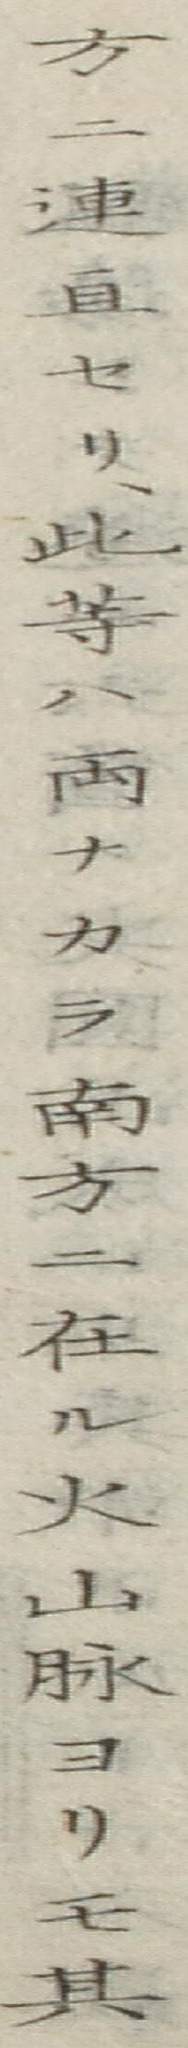方ニ連直セリ、此等ハ両ナカラ南方ニ在ル火山脈ヨリモ其
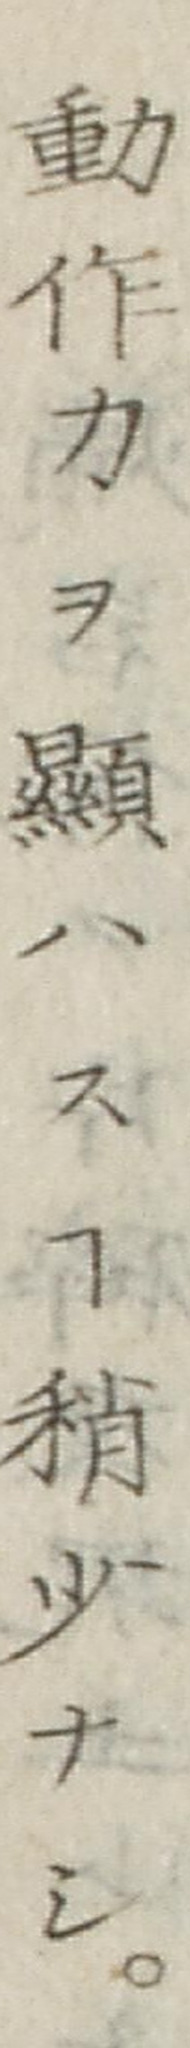動作力ヲ顕ハスヿ稍少ナシ。
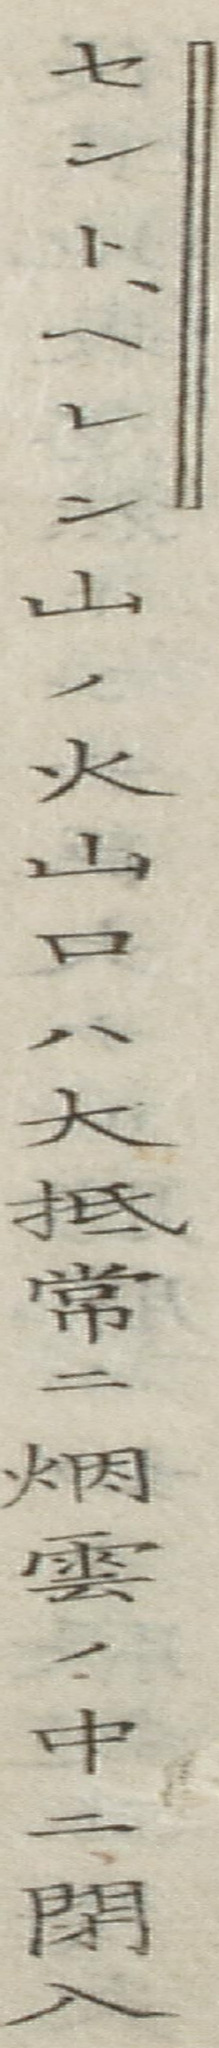セント、ヘレン山ノ火山口ハ大抵常ニ煙雲ノ中ニ閉入
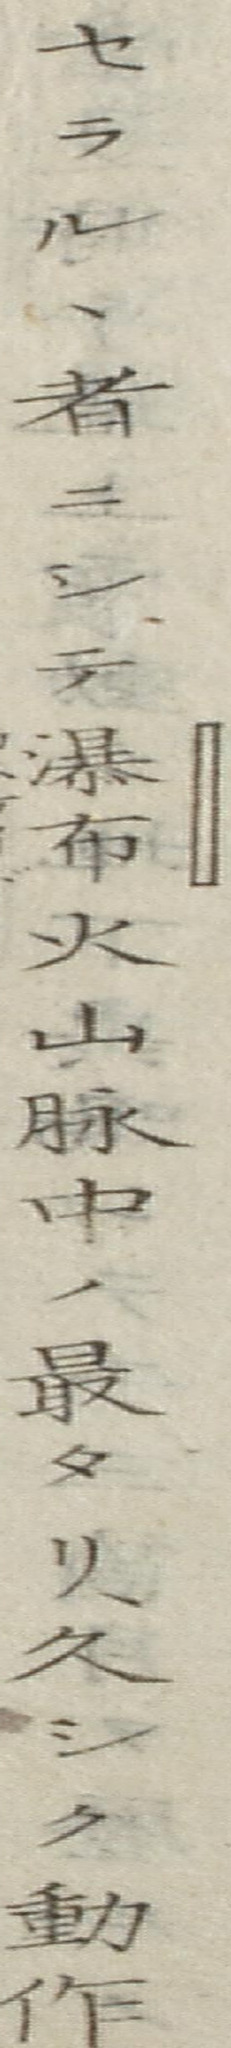セラル、者ニシテ瀑布火山脈中ノ最タリ、久シク動作
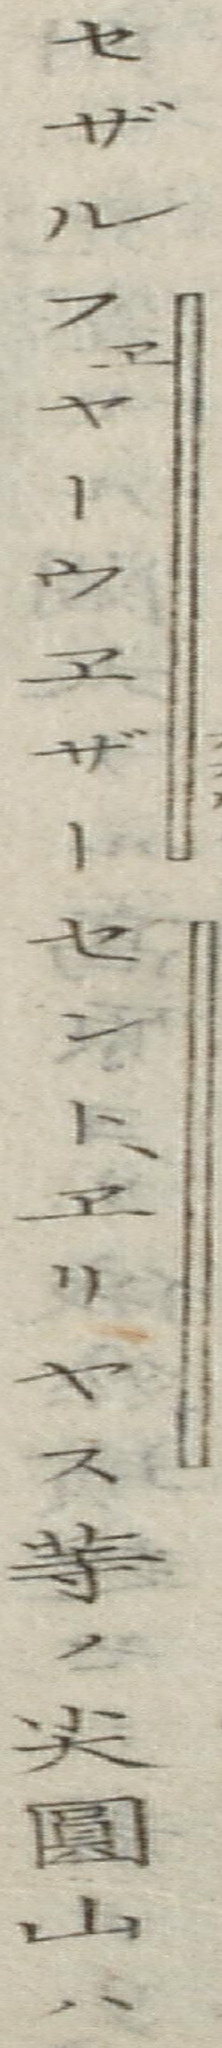セザルフヱヤーウヱザーセント、ヱリヤス等ノ尖円山ハ
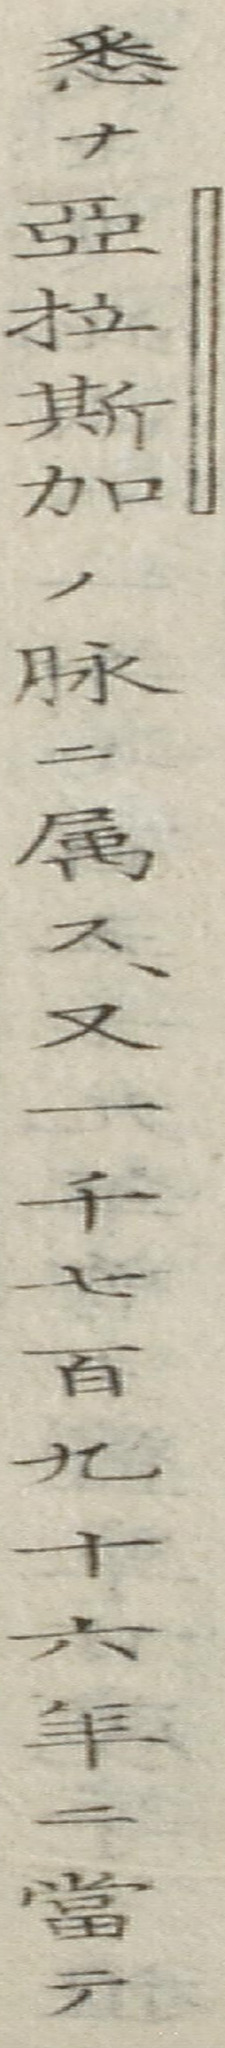悉ナ亜拉斯加ノ脈ニ属ス、又一千七百九十六年ニ当テ
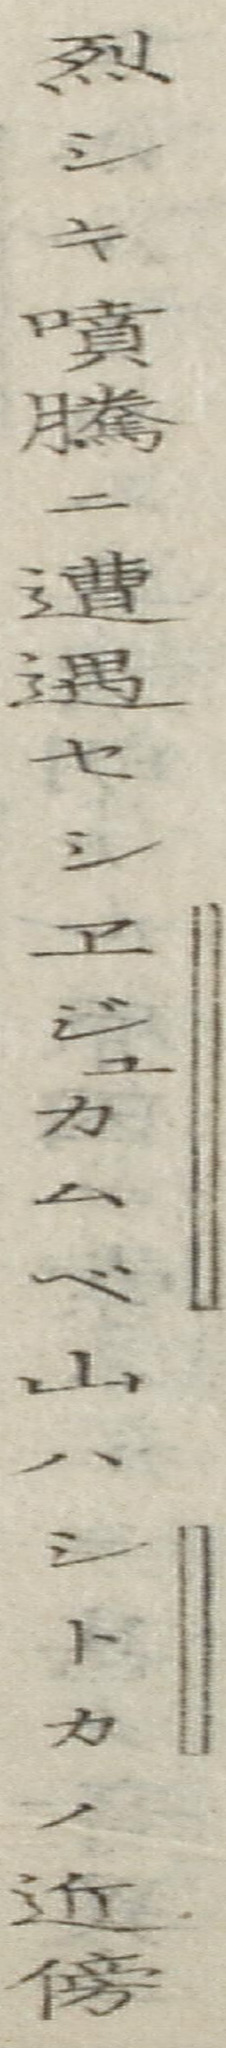烈シキ噴騰ニ遭遇セシヱジュカムベ山ハシトカノ近傍
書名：地形論　巻二
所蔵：東京大学地震研究所図書室 Earthquake Research Institute Library, The University of Tokyo, JAPAN
